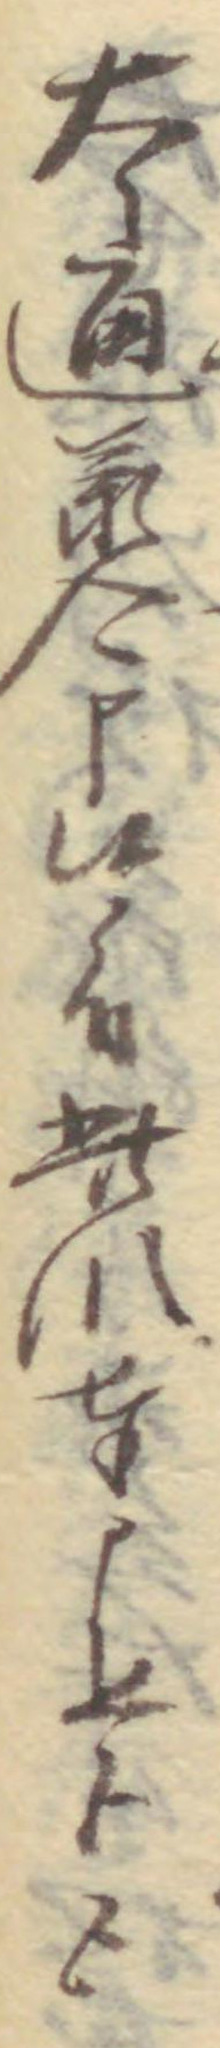右之通承合申候ニ付此段奉申上候已上
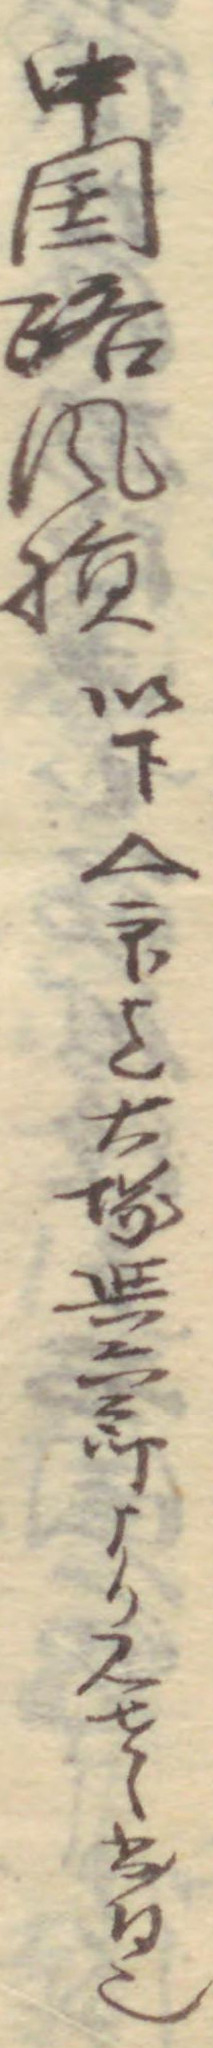中国路風損以下△印迄大塚與六郎より見せ候書付也
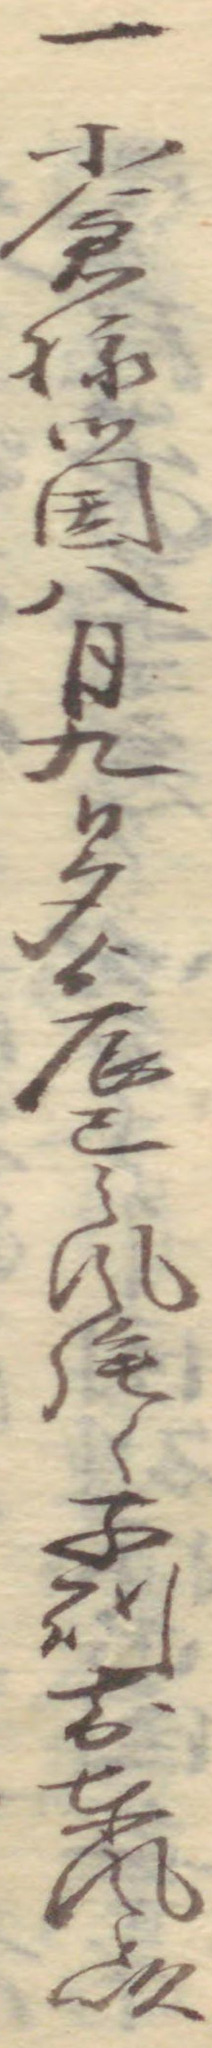一小倉様御国八月九日夕ゟ辰巳之風強く子刻前東風ニ吹
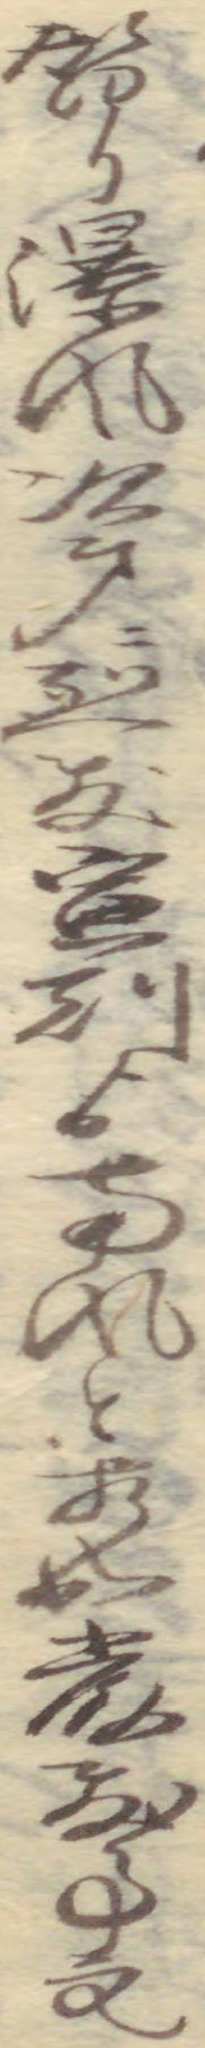替り爆風次第ニ烈敷寅刻ゟ南風と相成厳敷事空
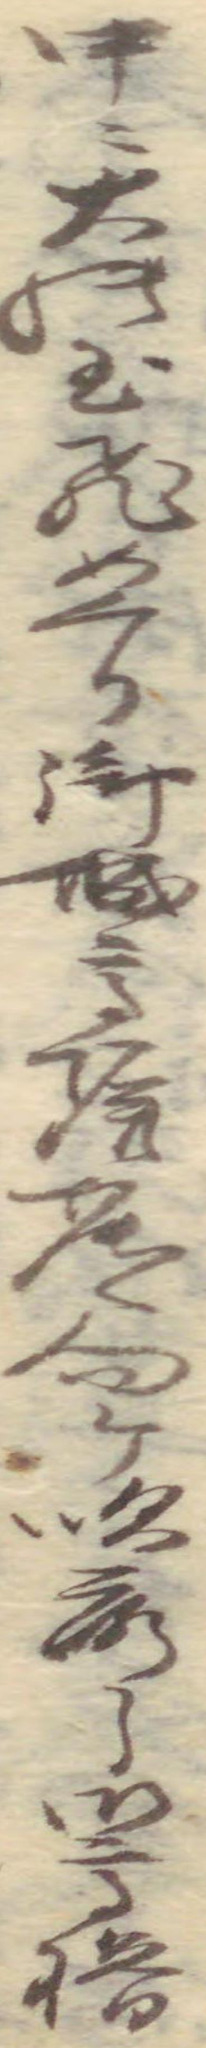中ニ火の玉飛めくり御城高塀堀へ向ケ吹落候御高櫓
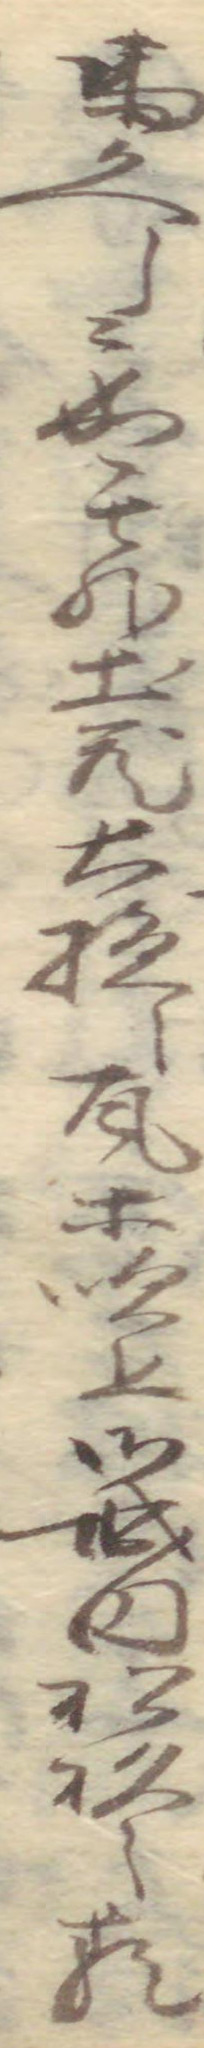馬かへしニ成其外土蔵大損し瓦等吹上御城内松杦之類
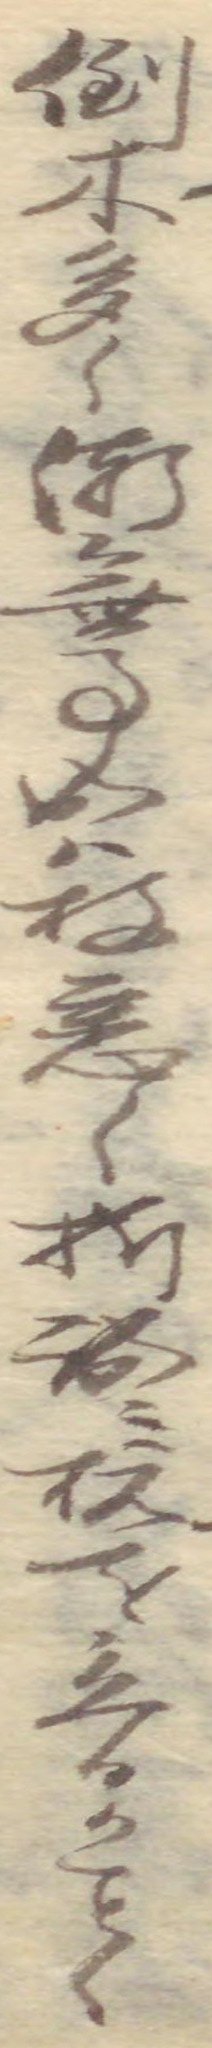倒木多く漸無事成ハ枝悉く折誠ニ杭を立るかことく
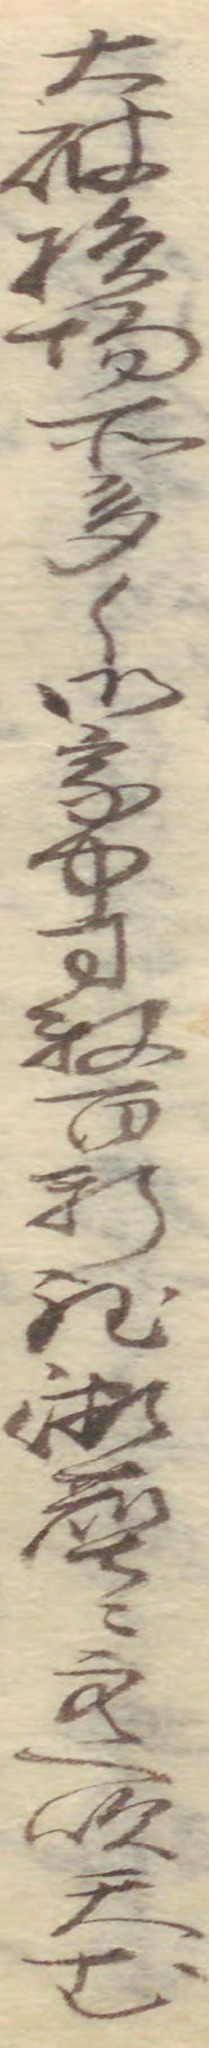大破損場所多く御家中方数百軒程微塵ニ空へ吹天む
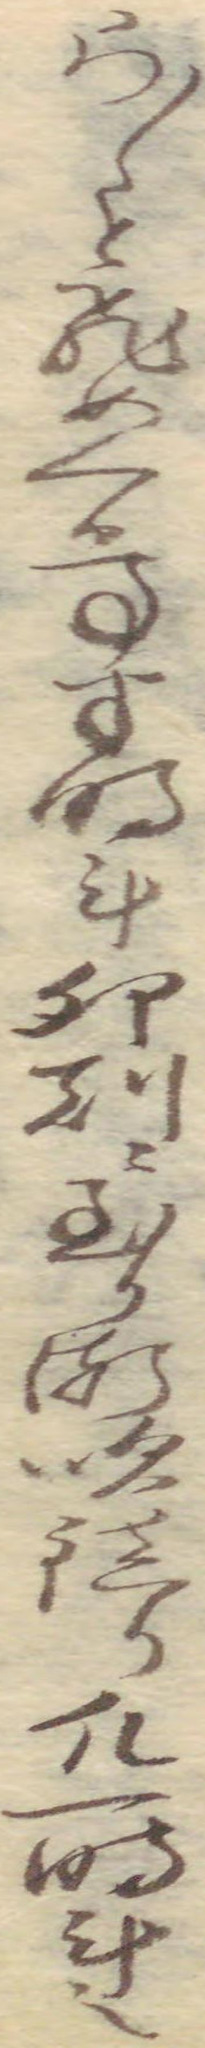ら〳〵と飛めくる方半時斗卯刻ニ至り漸吹鎮り凡一時斗之
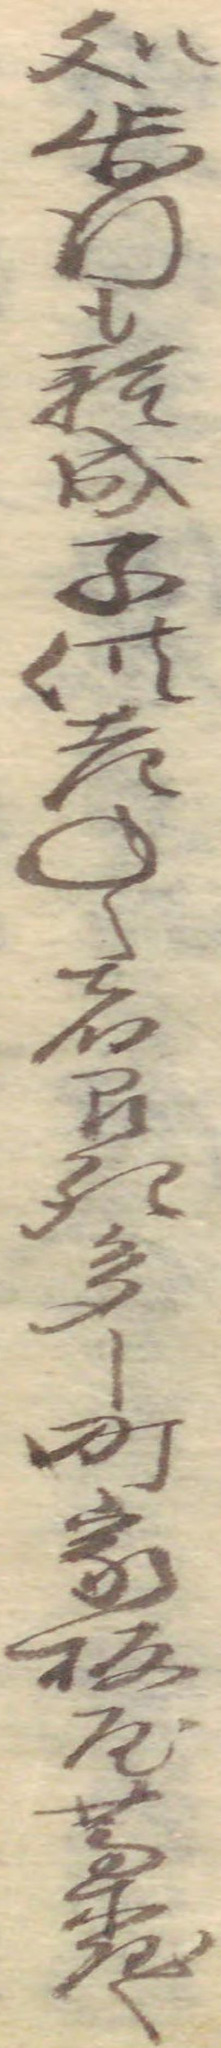処歩行も難成子供老年之者即死多し町家板屋藁屋之
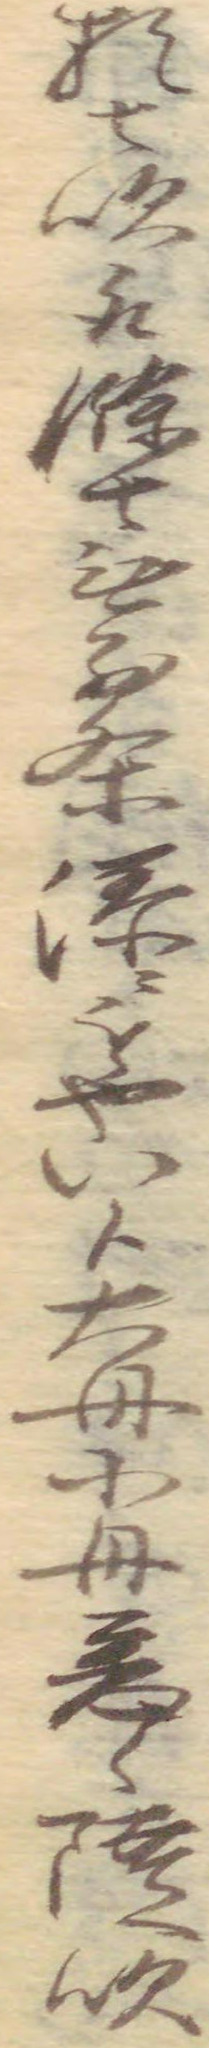類は吹取餘は無別条湊ニもやい候大舟小舟悉く陸へ吹

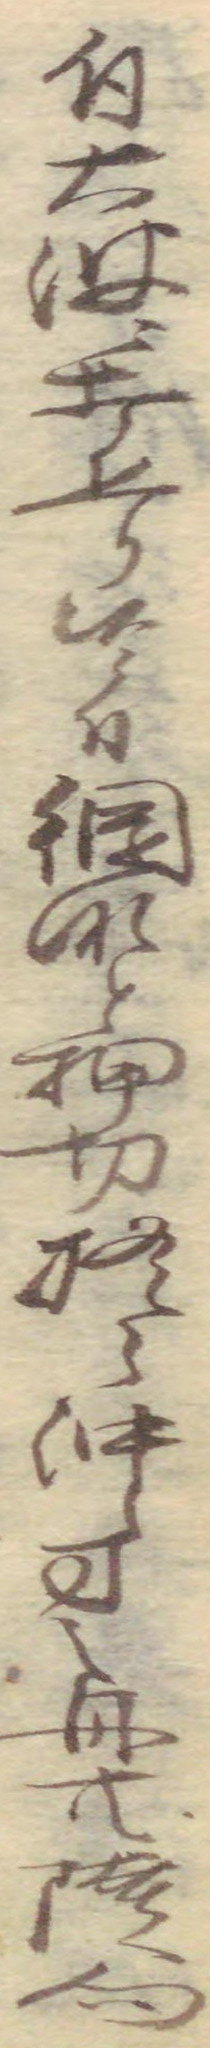付大破ニ打上り候ニ付綱なと押切猶々沖之方之舟共陸へ向
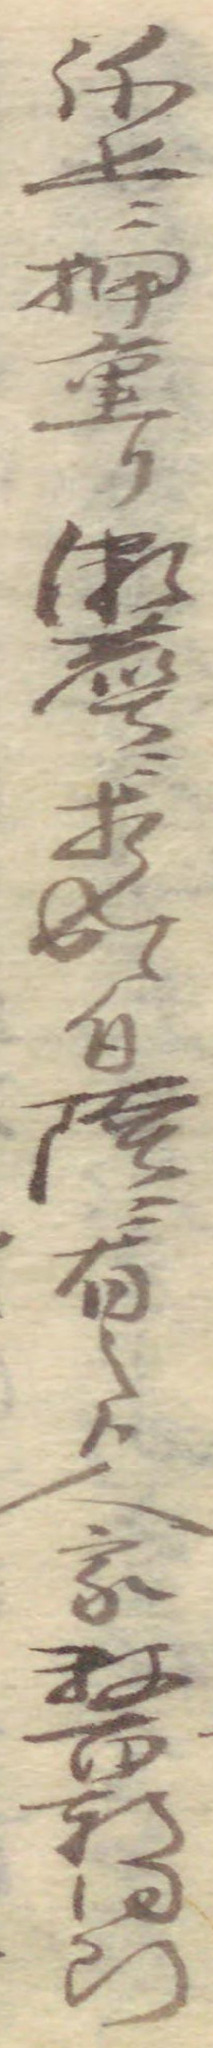弥上ニ押重り微塵ニ相成候付陸ニ有之候人家数百軒同断
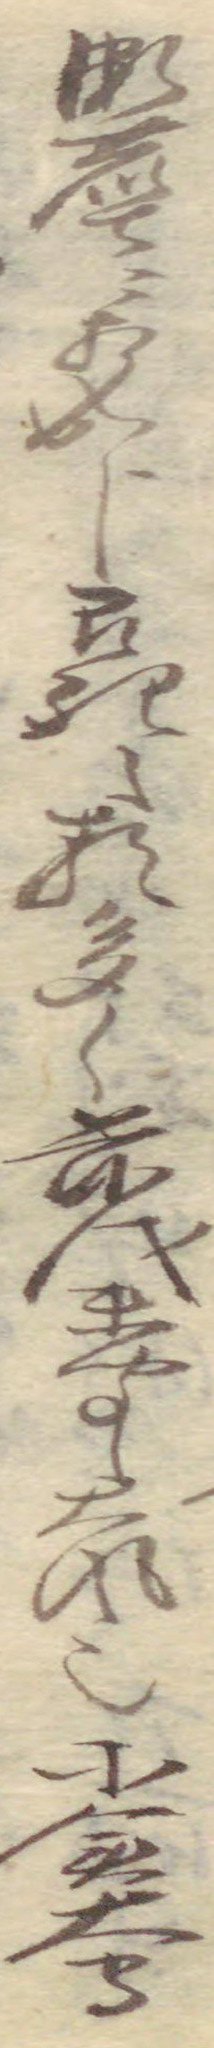微塵ニ相成申候即死之類多く前代未聞之大風也小倉大守
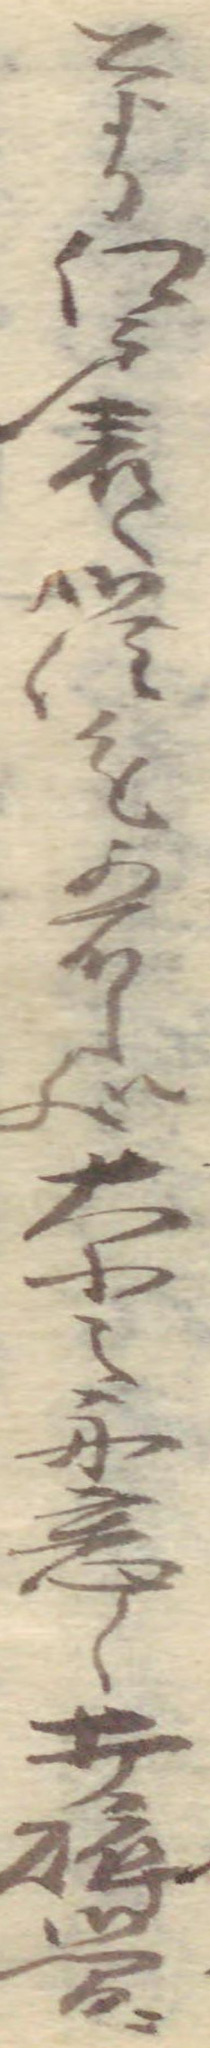公より江戸表へ御注進可有之処大小之舟悉く打砕御間ニ
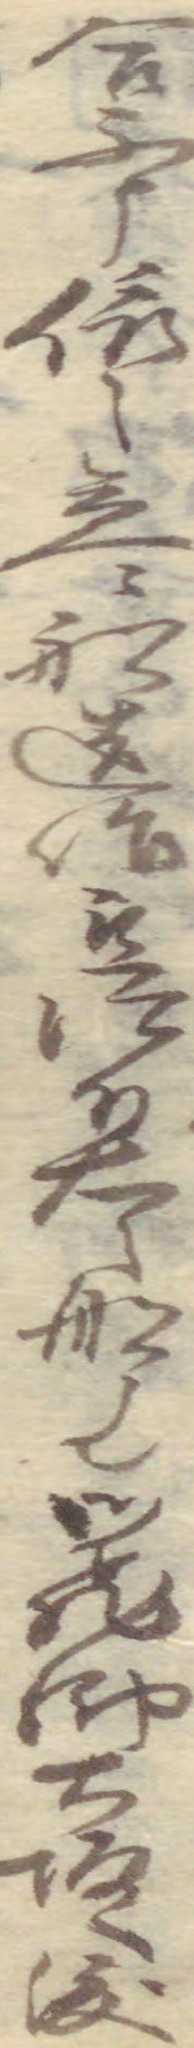合不申依之急ニ船造作被仰付右之船ニて御飛脚大坂へ渡
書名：鶯宿雑記. 巻199-200
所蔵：国立国会図書館 National Diet Library, JAPAN
